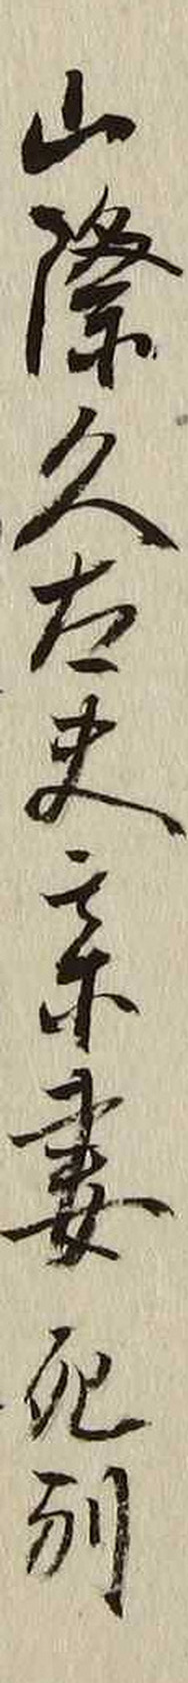女山際久太夫某妻死別
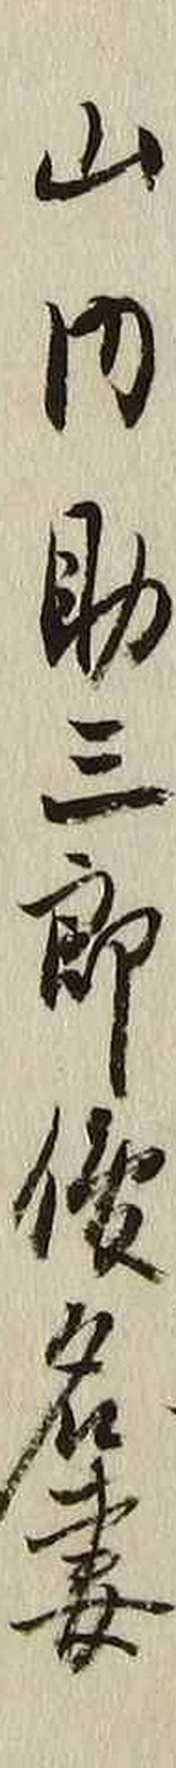山内助三郎俊名妻
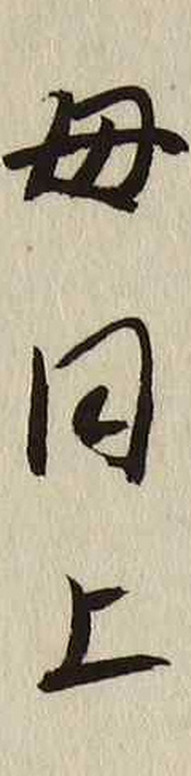母同上
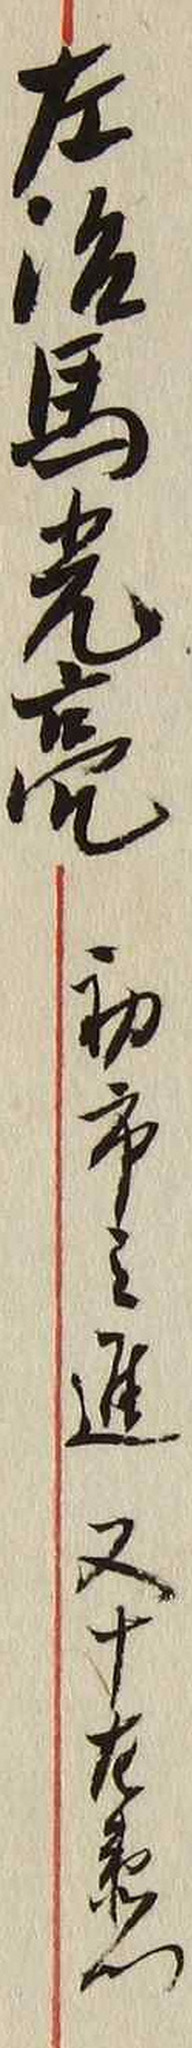左治馬光亮初市之進又十左衛門
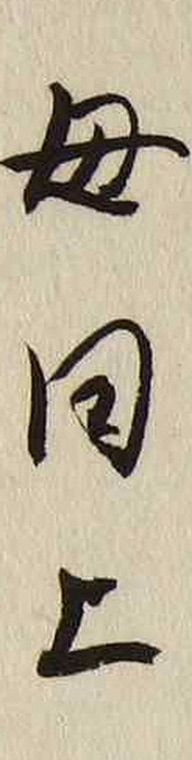母同上

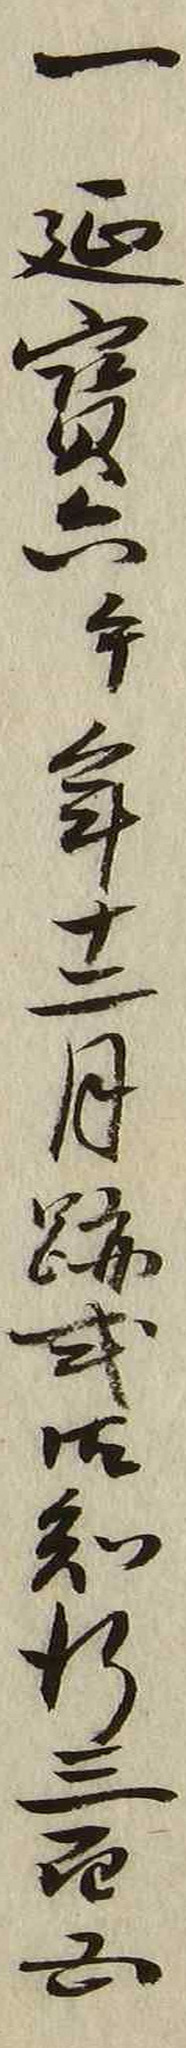一延宝六午年十二月跡式御知行三百五
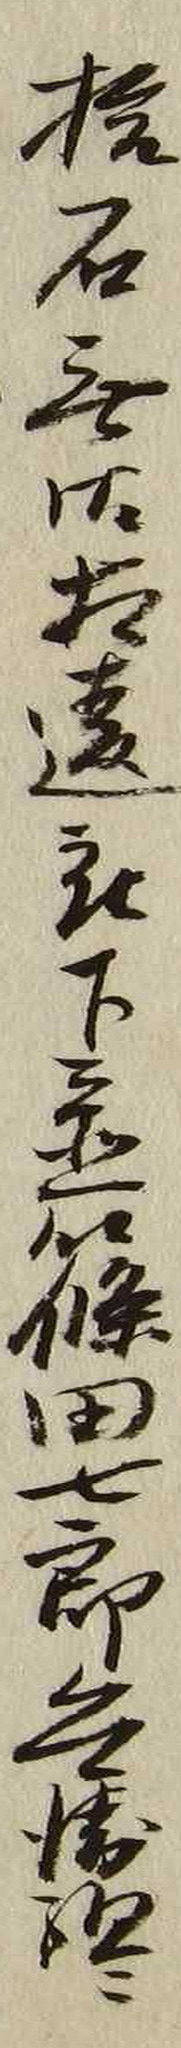拾石無御相違被下置篠田七郎兵衛組ニ
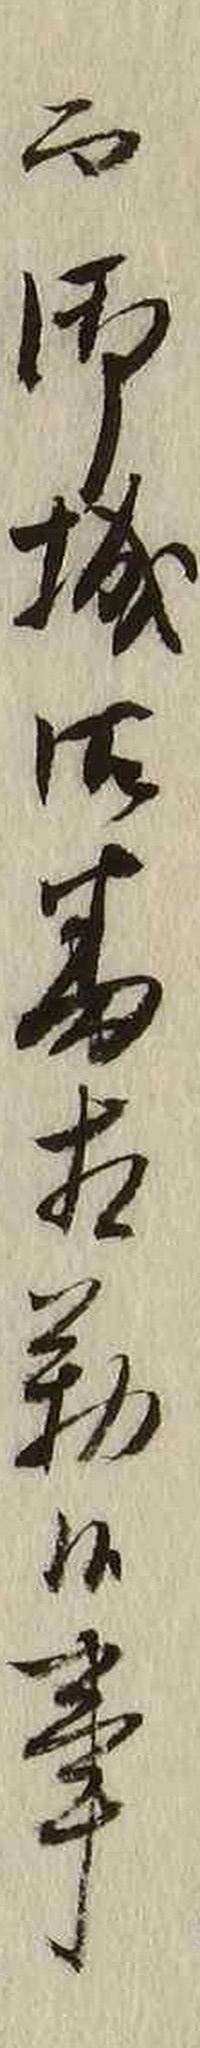而御城御番相勤候事
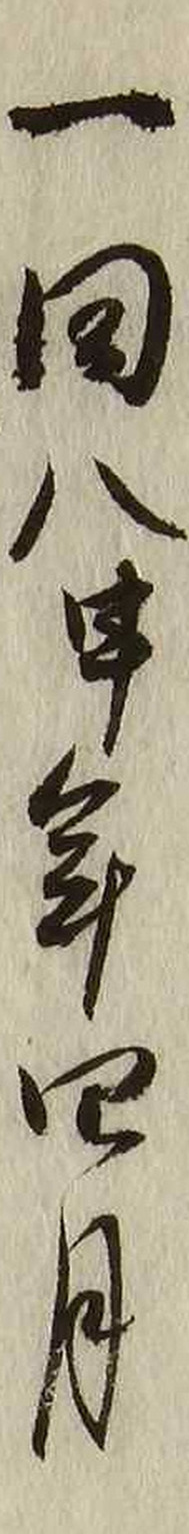一同八申年四月
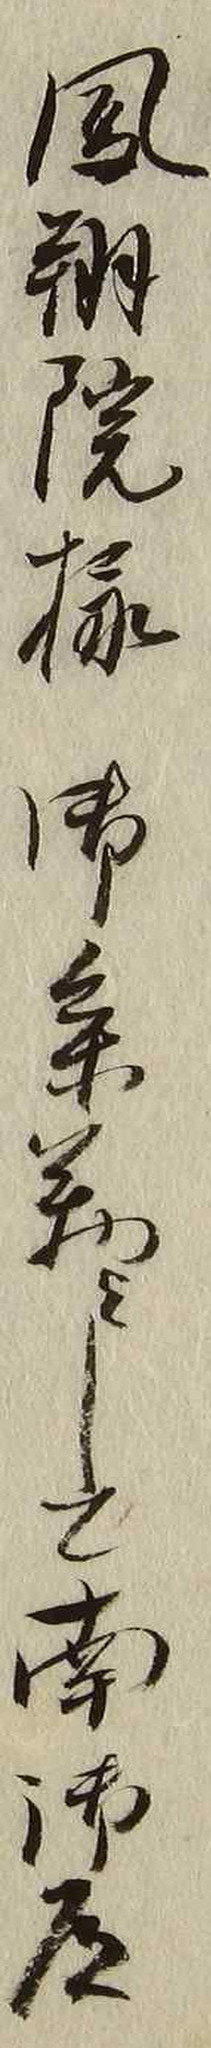鳳翔院様御参勤与して南御道
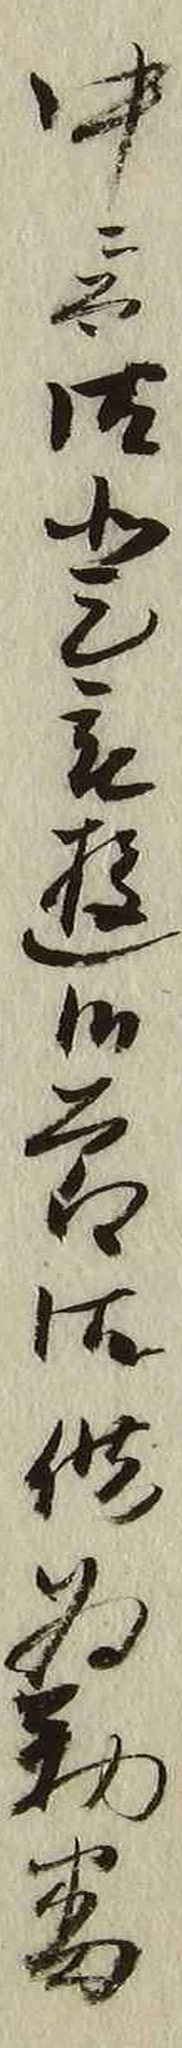中ニ而御登被遊候節御供為勤番
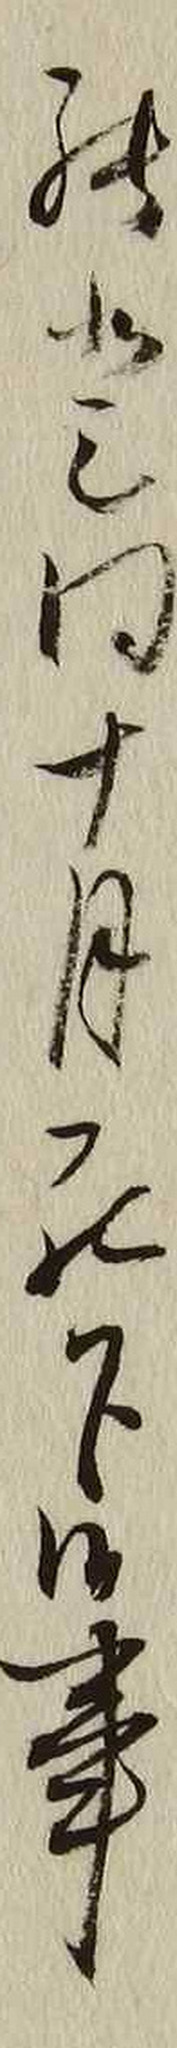罷登同十月罷下候事
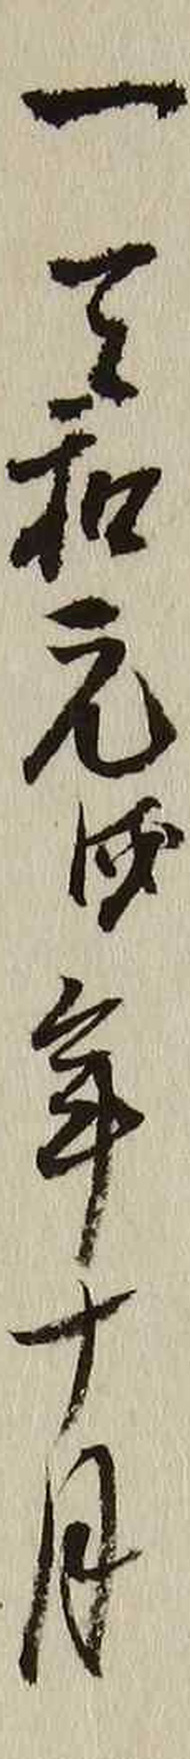一天和元戌年十月
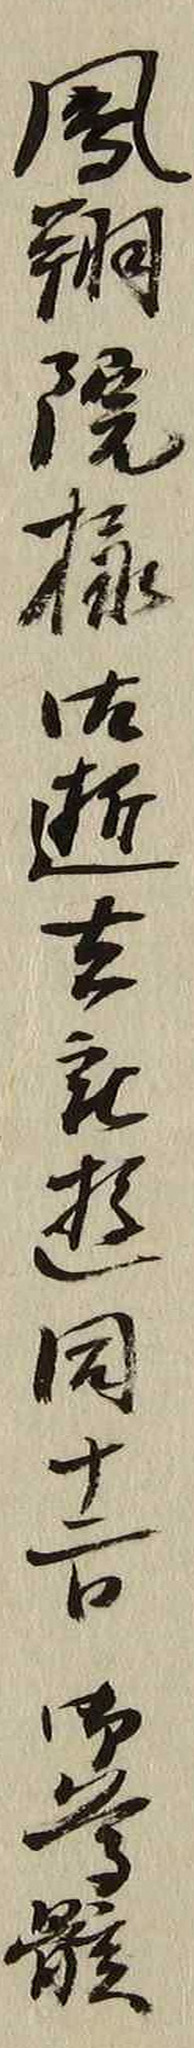鳳翔院様御逝去被遊同十二日御尊骸
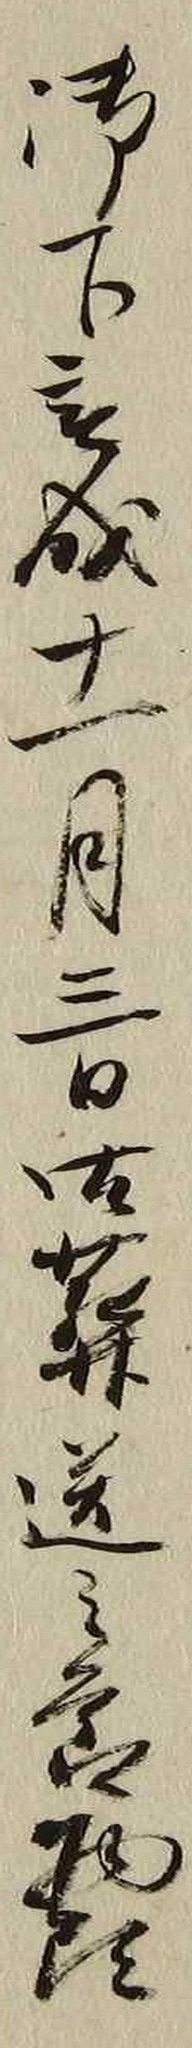御下被成十一月三日御葬送之節物頭
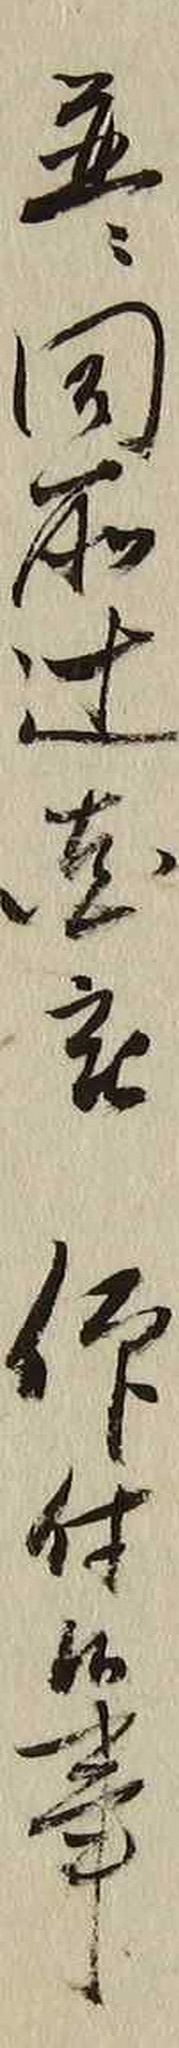並ニ同所辻固被仰付候事
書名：諸士系譜　巻之356　す之部6
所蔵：会津若松市立会津図書館
